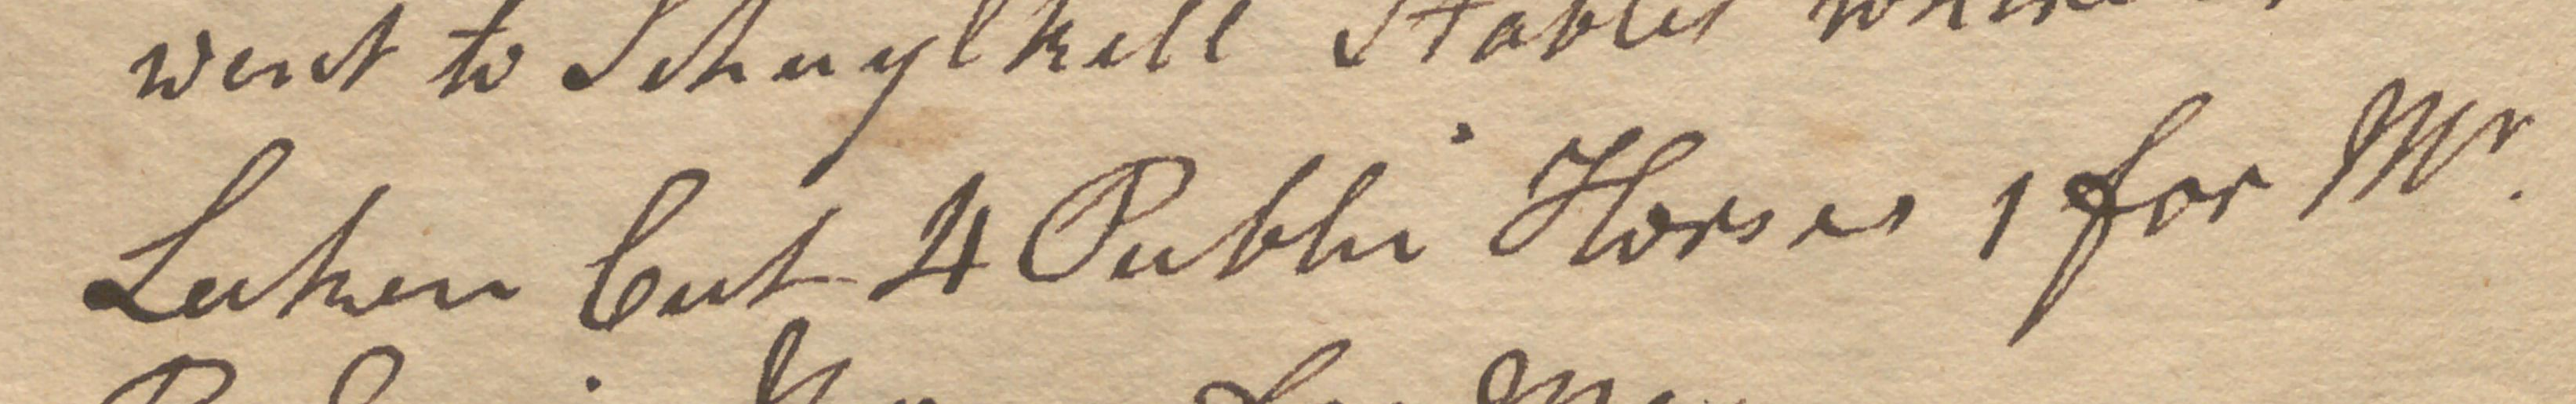Luken Cut 4 Public Horses for M^r.
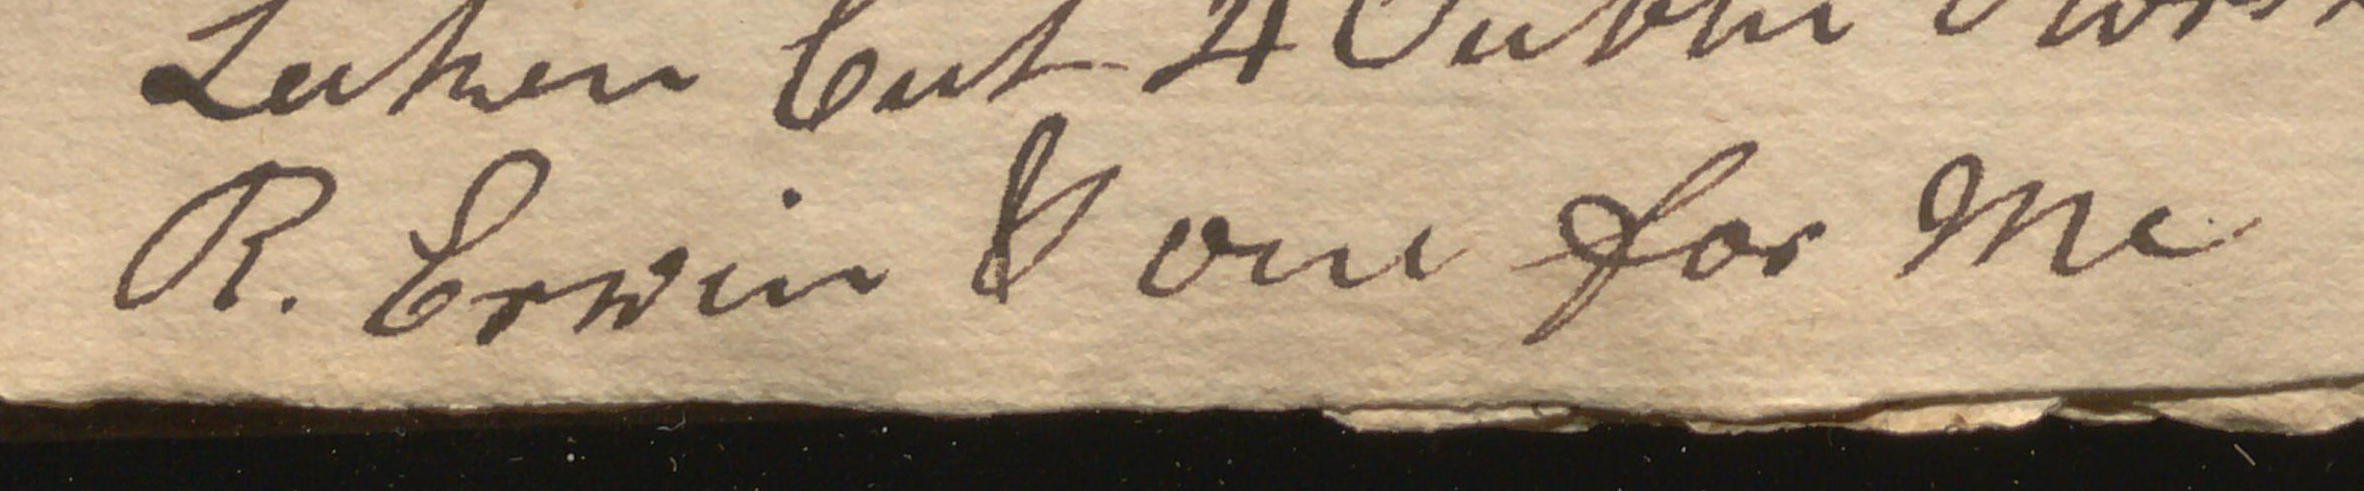R. Erwin & one for me
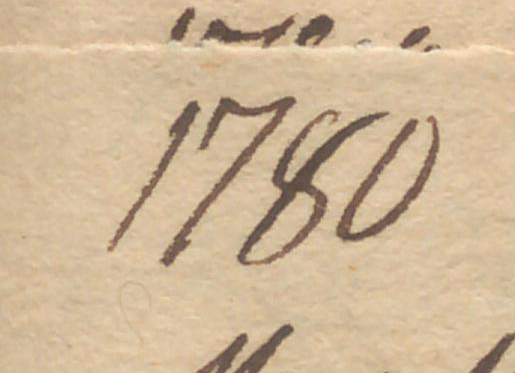1780
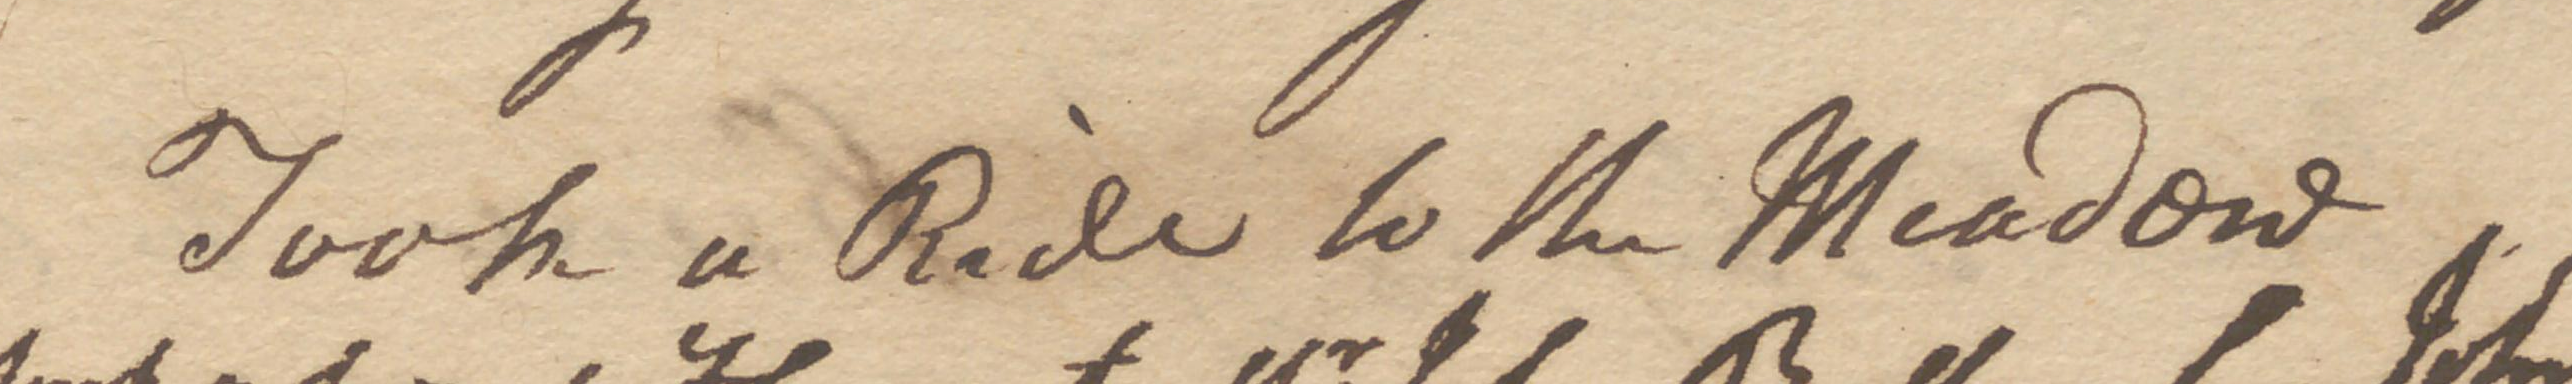Took a Ride to the Meadow
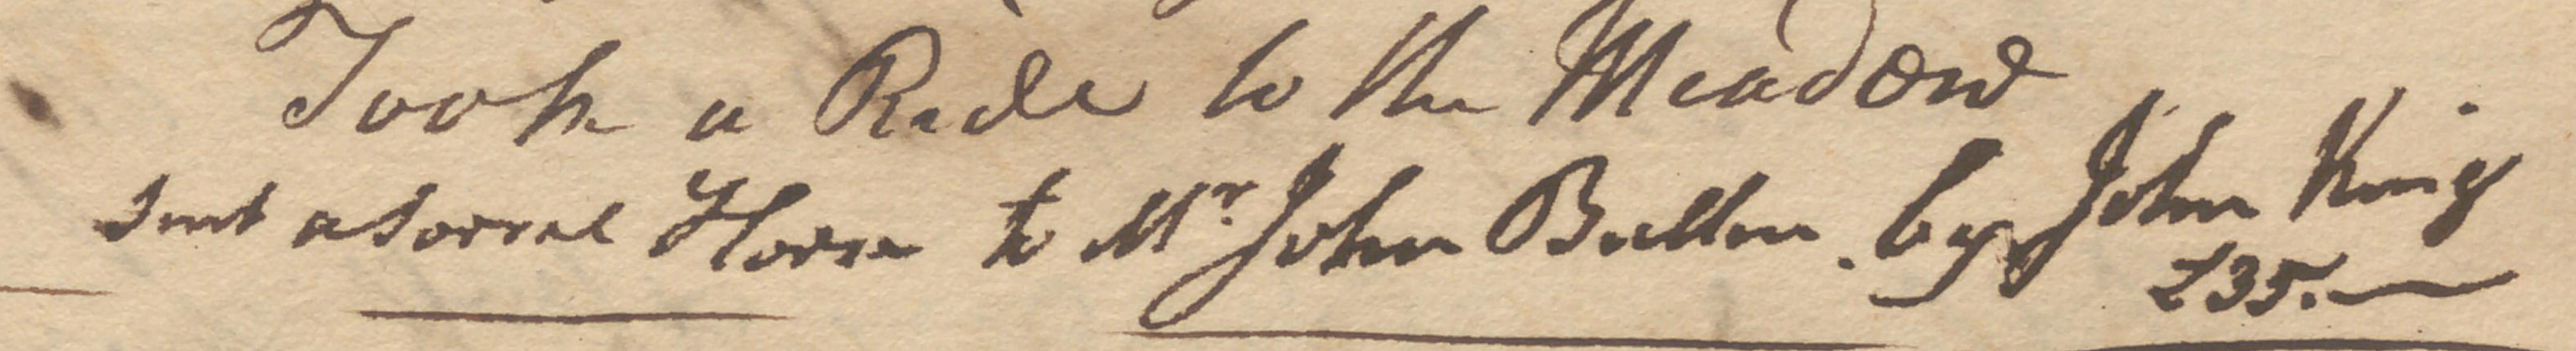sent a sorrel Horse to M^r. John Bullen by. John King
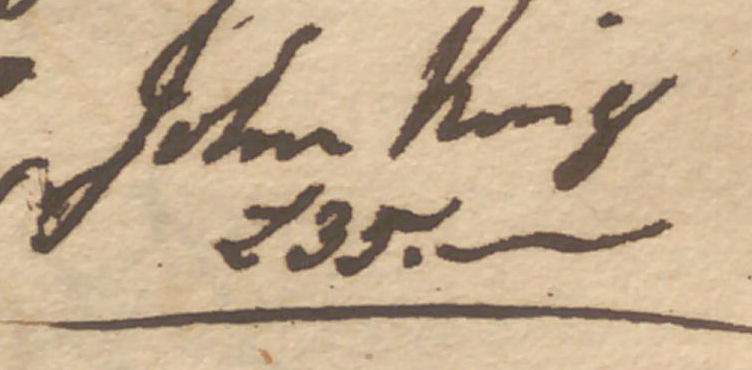£35.-
